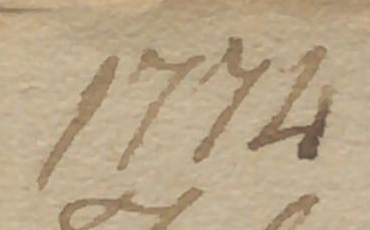1774
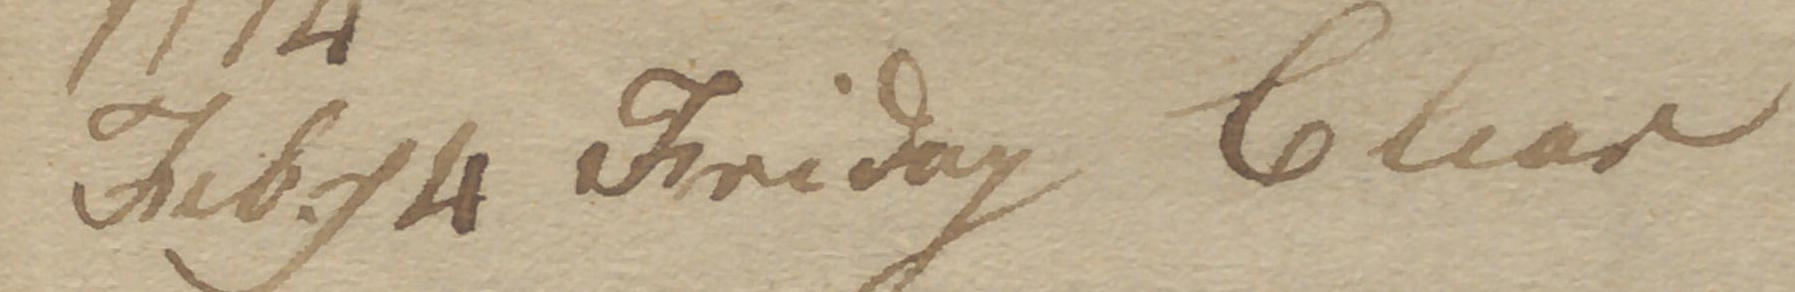Feb^y. 4 Friday Clear
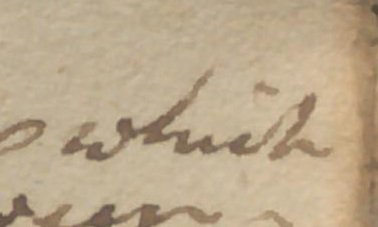which
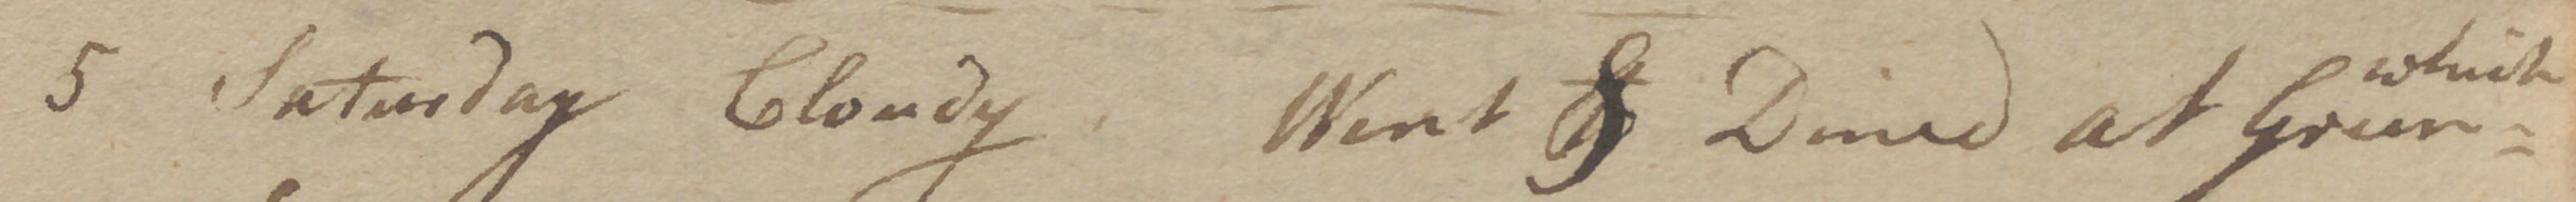5 Saturday Cloudy. Went & Dined at Green-
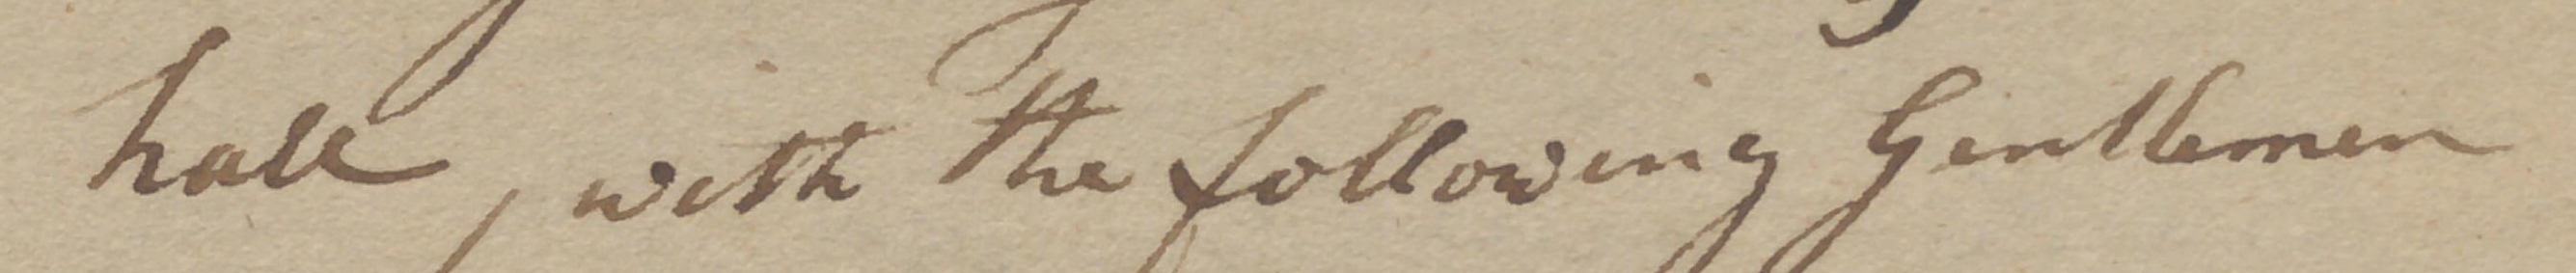hall, with the following Gentlemen
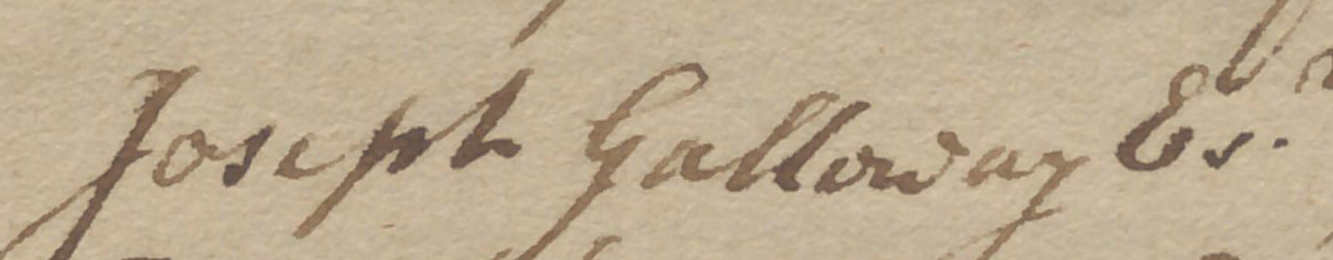Joseph Galloway Es^r.
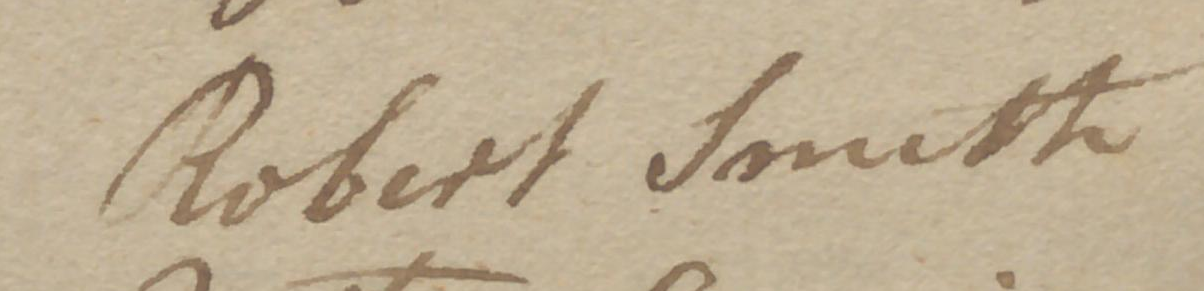Robert Smith
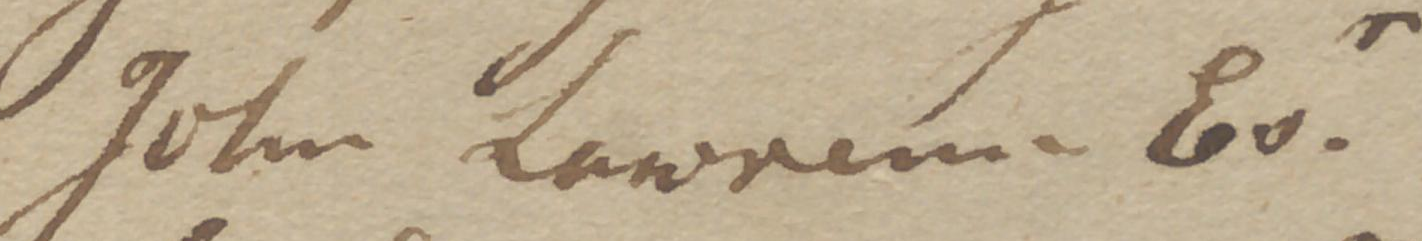John Lawrem Es^r.
